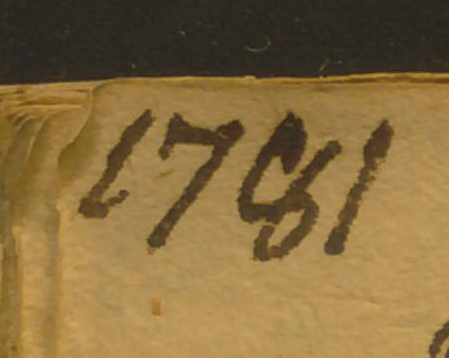1781
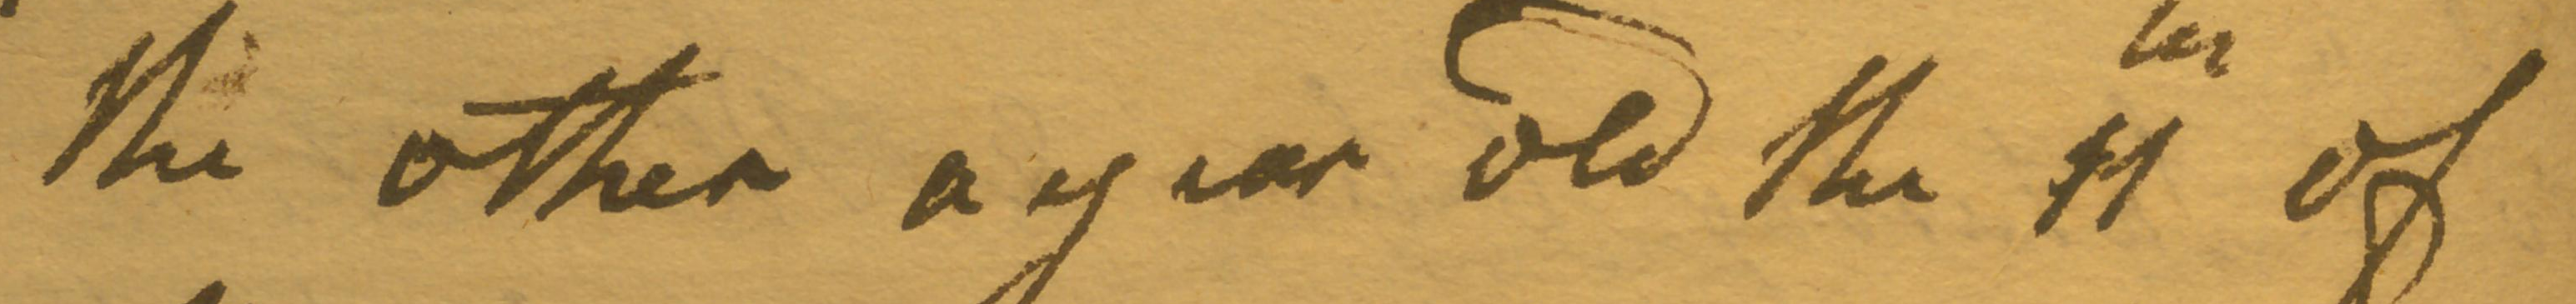the other a year old the 11^th of
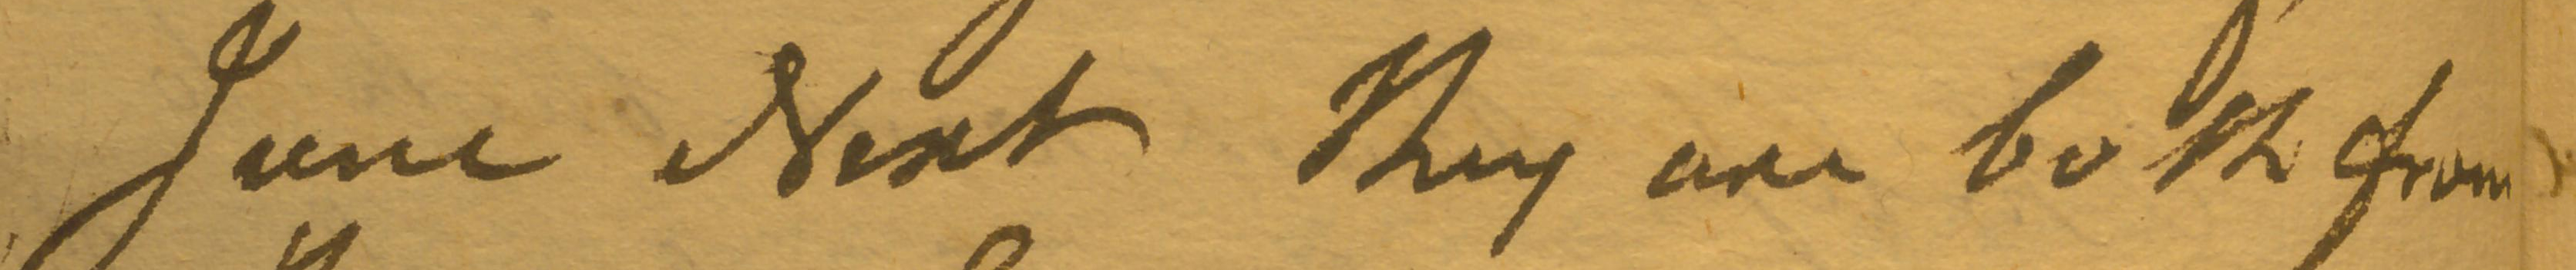June Next. They are both from
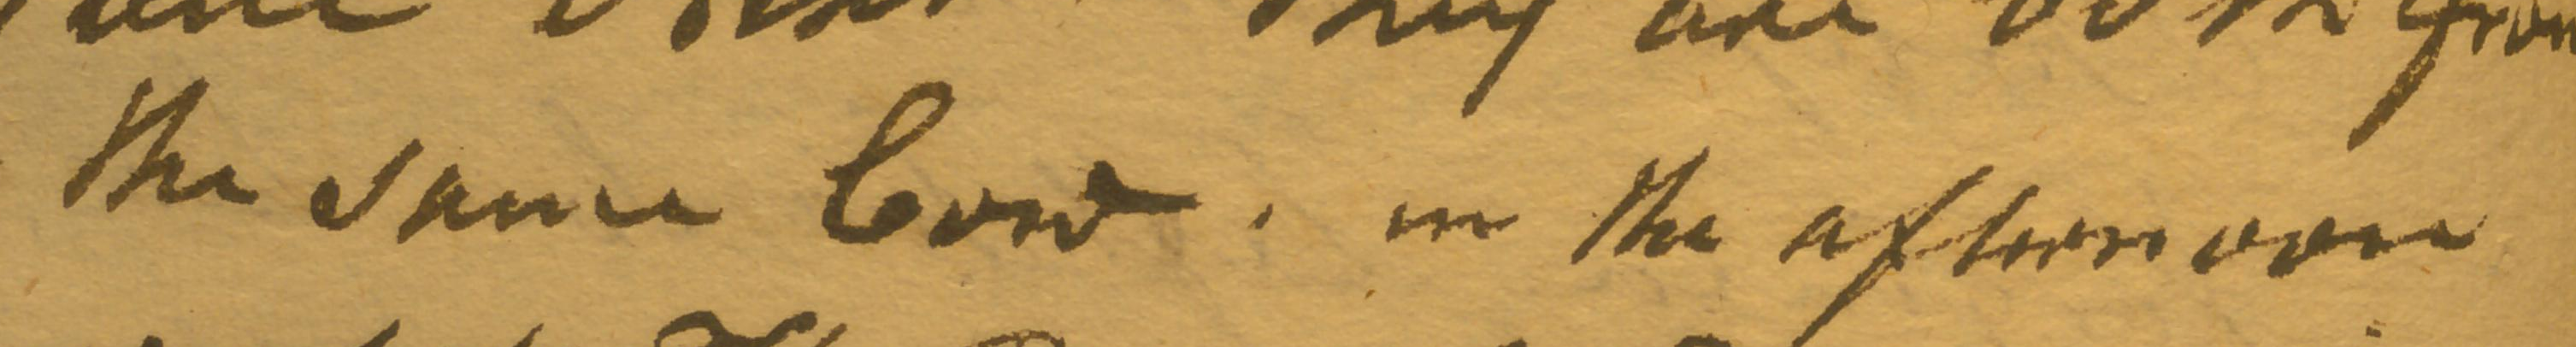the same Cow, in the afternoon
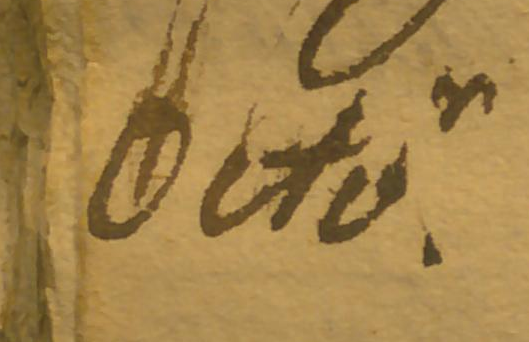Octo^r.
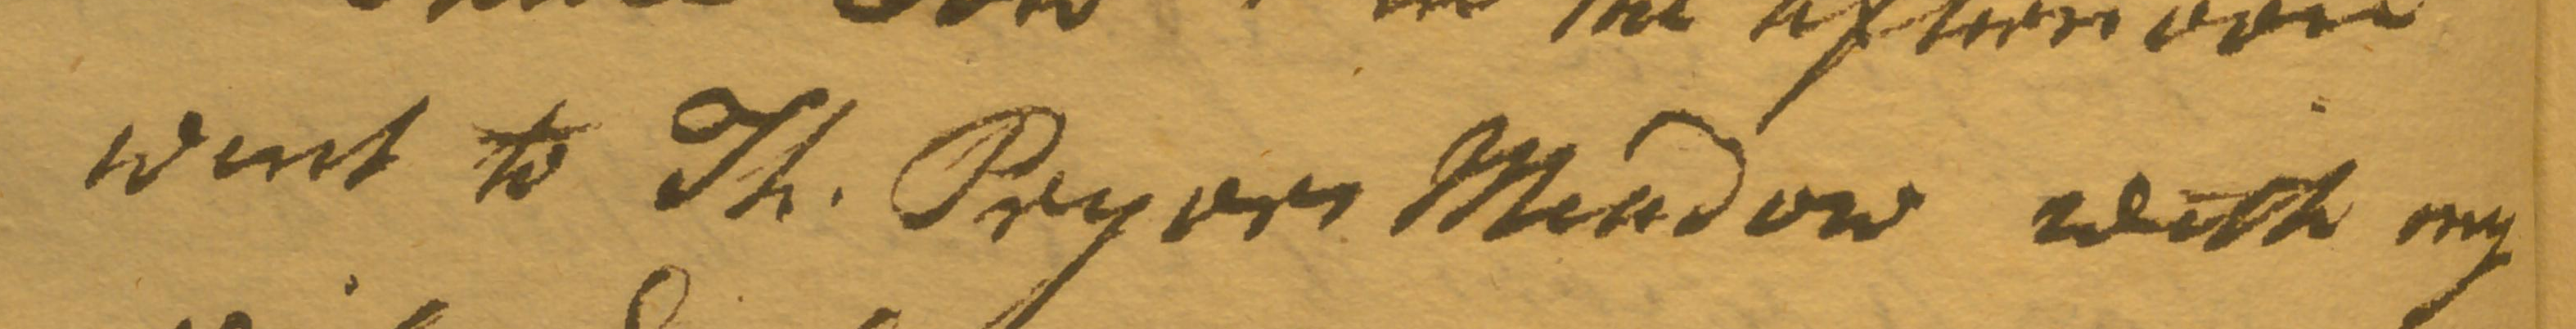went to Th. Pryors Meadow with my
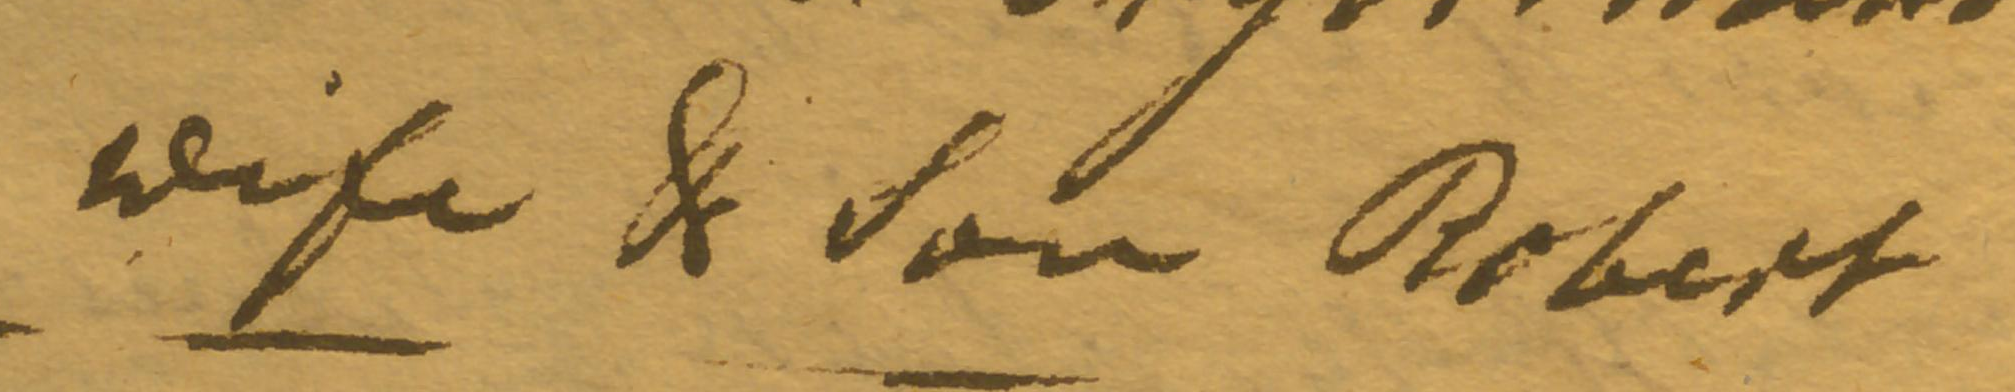wife & son Robert
